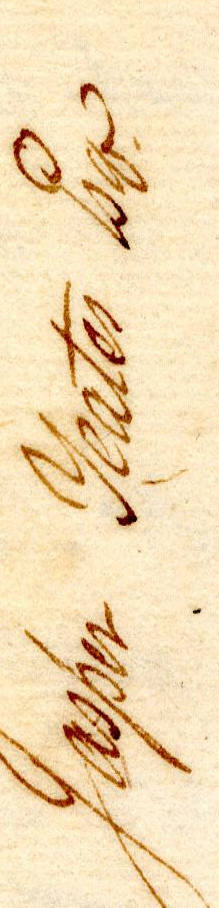Jasper Yeates Esq.
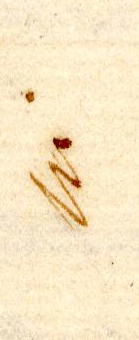in
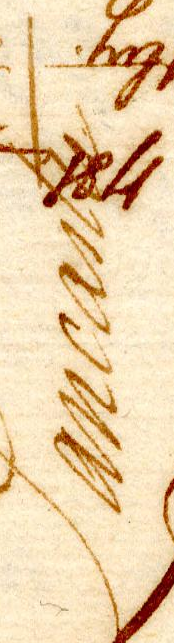Lancaster
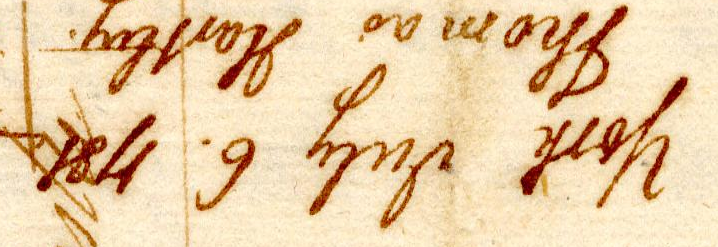York July 6. 1781
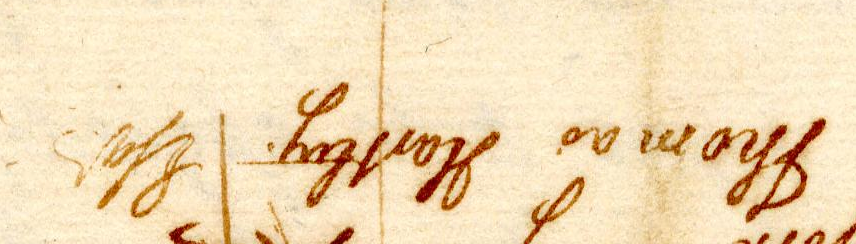Thomas Hartley Esq^r.
